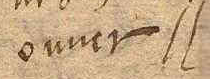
ouuer //
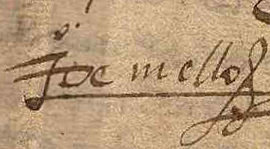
Jo de mello
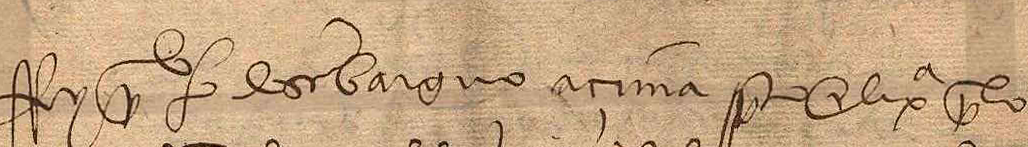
ffoy p̄do ho desēbarguo acima sp̄to ē lixa p̄lo
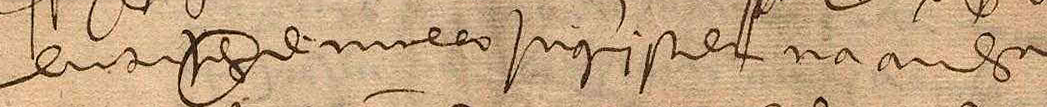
doutor Johā de mello Jnqujsidor na audja
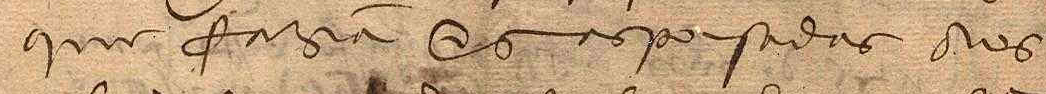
que fazia ē suas pousadas Aos
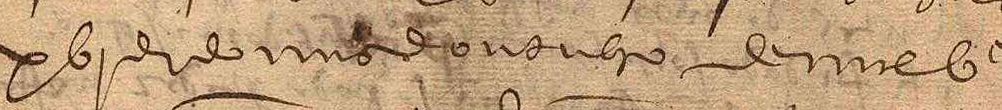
xbj di do mes doutubro de mil bc
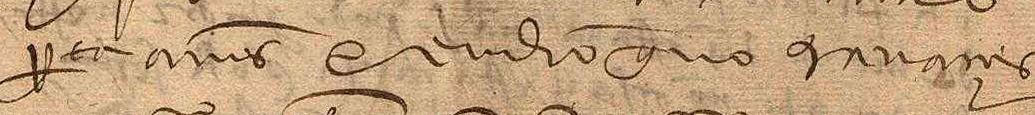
Rta anos e eu dioguo trauaços
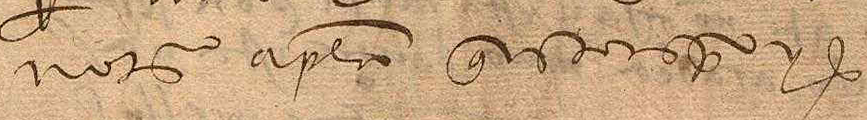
notro ap̄lco q̄ esto esp̄vy
